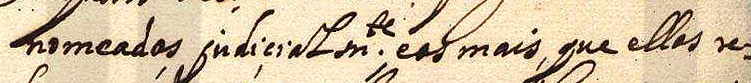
nomeadas judicialm.te, e as mais, que elles re
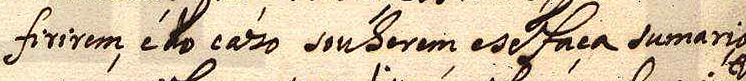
firirem, e do caso souberem, e se faça sumario
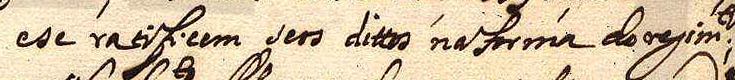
e se ratificem seos dittos na forma do regim.to
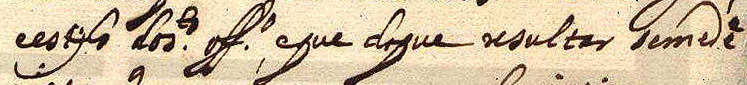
e estilo do s.to off.o, e que do que resultar se me de
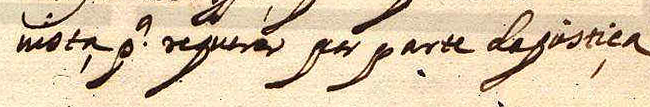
uista p.a requerer por parte da justiça
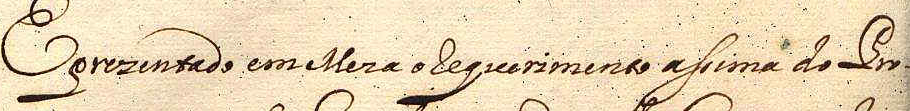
E prezentado em Meza o Requerimento assima do Pro
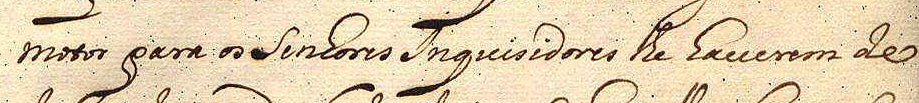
motor para os Senhores Inquisidores lhe hauerem de
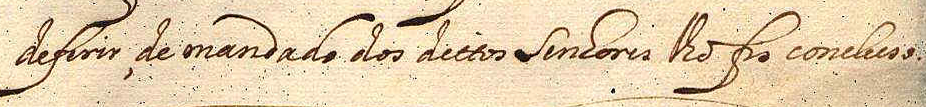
deferir de mandado dos dittos Senhores lho fis concluso.
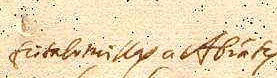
feita comissaõ a Abrātes
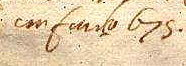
em feuro 675.
